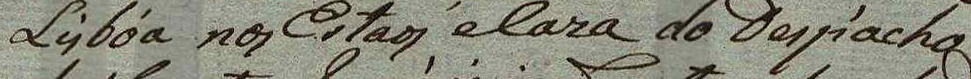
Lisbóa nos Estaos, e Caza do Despacho
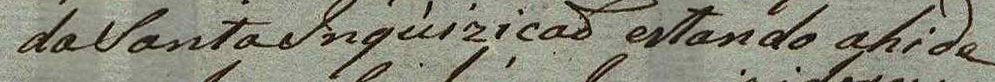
da Santa Inquiziçaõ estando ahi de
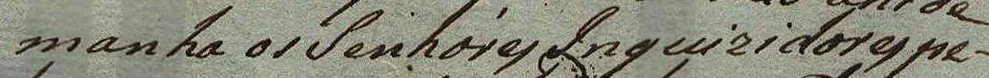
manha os Senhores Inquizidores pe
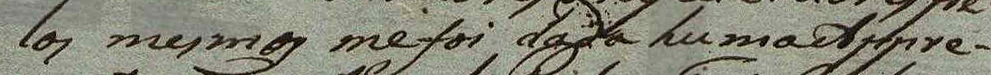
los mesmos me foi dada huma Appre
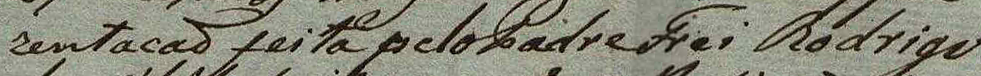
zentaçaõ feita pelo Padre Frei Rodrigo
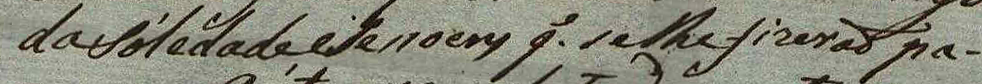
da Soledade e Sessoens q̄ se lhe fizeraõ pa
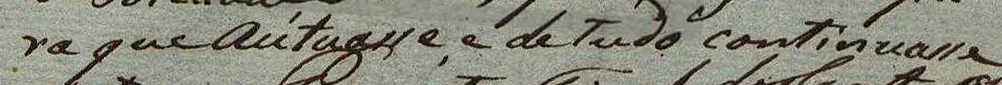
ra que autuasse, e de tudo continuasse
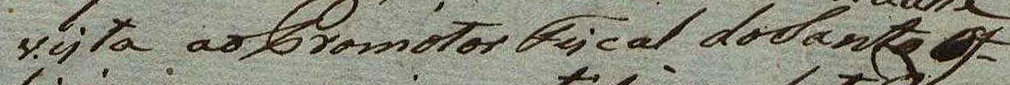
vista ao Promotor Fiscal do Santo Of
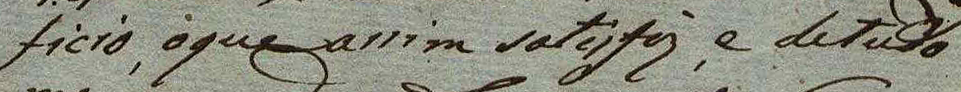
ficio, o que assim satisfez, e de tudo
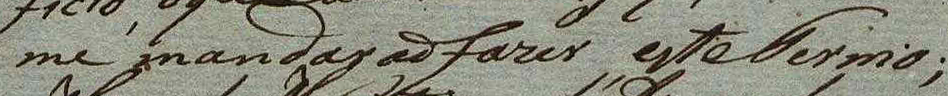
me mandaraõ fazer este Termo;
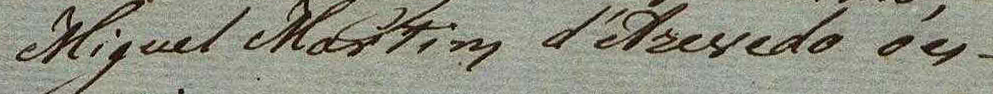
Miguel Martins d'Azevedo o es
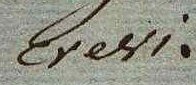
crevi.
